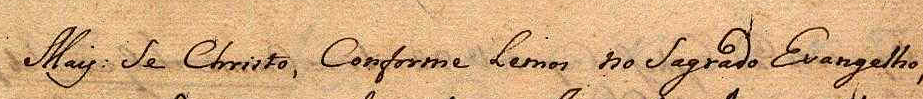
Mais se Christo, Conforme Lemos no Sagrado Evangelho,
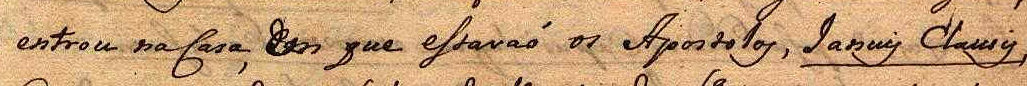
entrou na Casa, e que estavaõ os Apostolos, Ianuis Clausis,
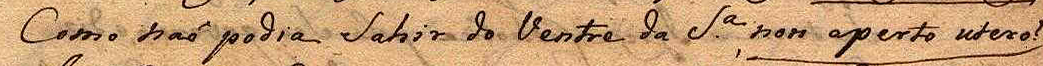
Como naõ podia sahir do Ventre da S.a, nom aperto utero?
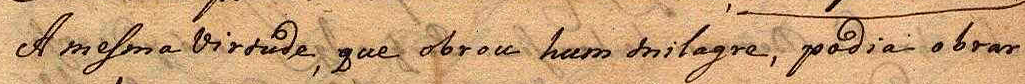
A mesma Virtude, que obrou hum milagre, podiaõ obrar
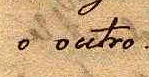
o outro.
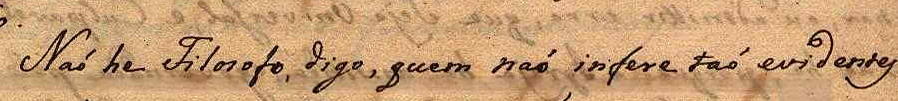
Naõ he Filosofo, digo, quem naõ infere taõ evidentes
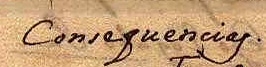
Consequencias.
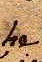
he
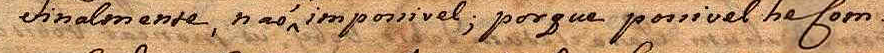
Finalmente, naõ impossivel; porque possivel he Com
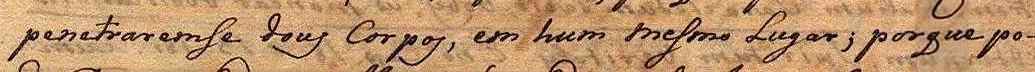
penetraremse dous corpos, em hum mesmo Lugar, porque po
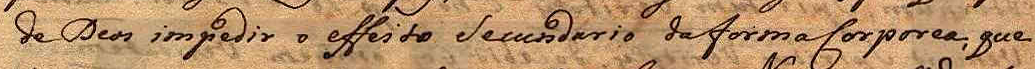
de Deos impedir o effeito secundario da forma Corporea, que
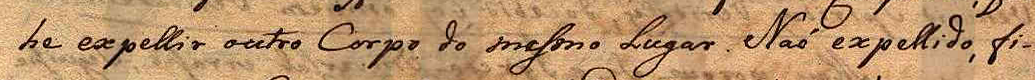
he expellir outro Corpo do mesmo Lugar Naõ expellido, fi
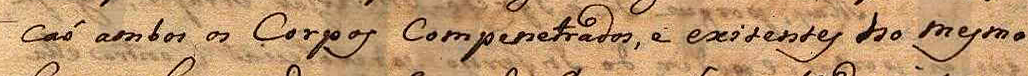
caõ ambos os Corpos Compenetrados, e exitentes no mesmo
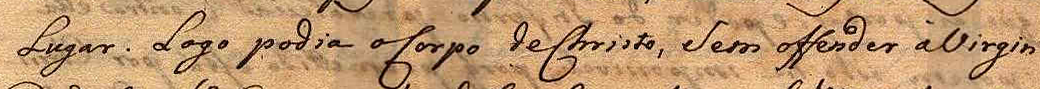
Lugar. Logo podia o Corpo de Christo, sem offender a Virgin
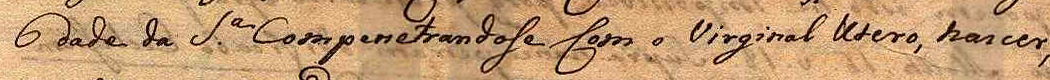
dade da S.a Compensetrandose Com o Virginal Utero, nascer,
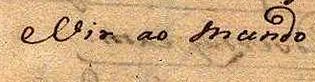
e Vir ao mundo
